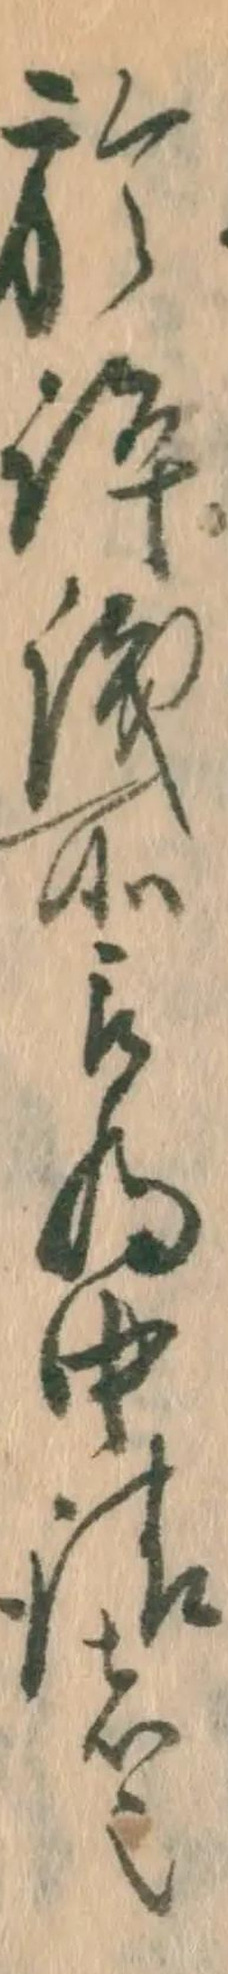於評議所被為申請者也
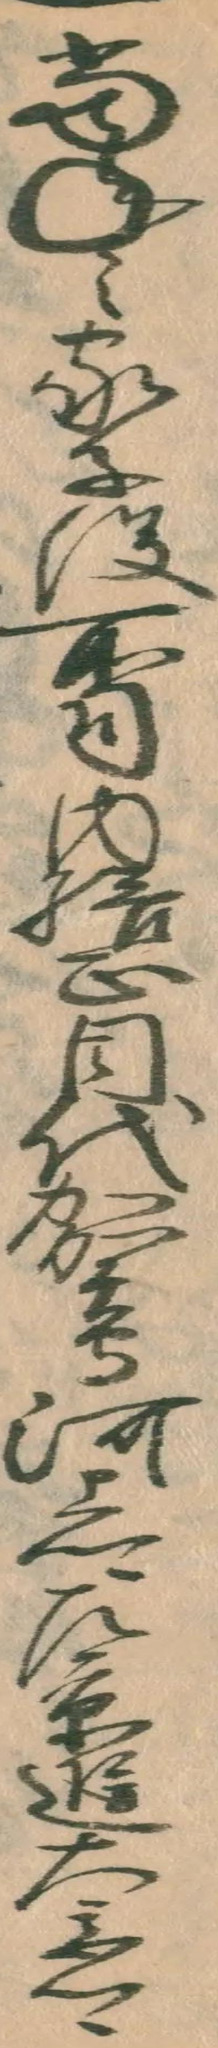一当年之家子役所司内膳正目代加賀守河上郷左京進大宮郷
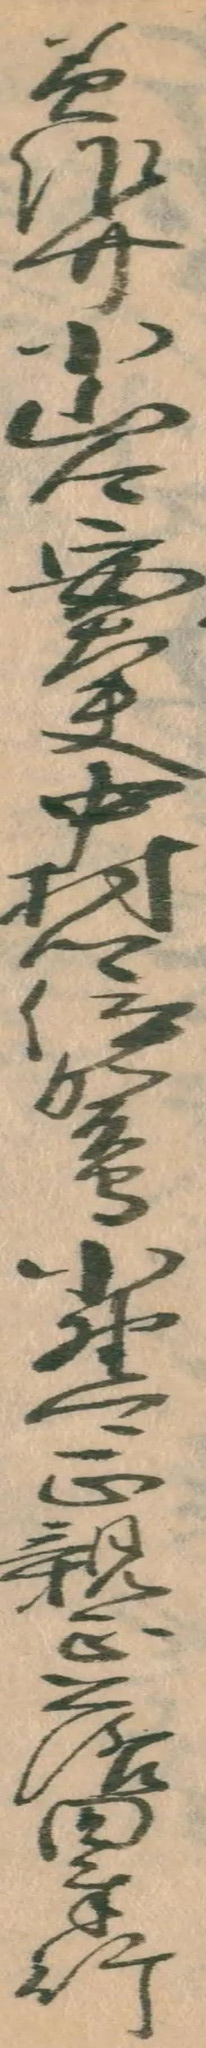美作介小山郷安大夫中村郷伊賀守小野郷正親正落田奉行
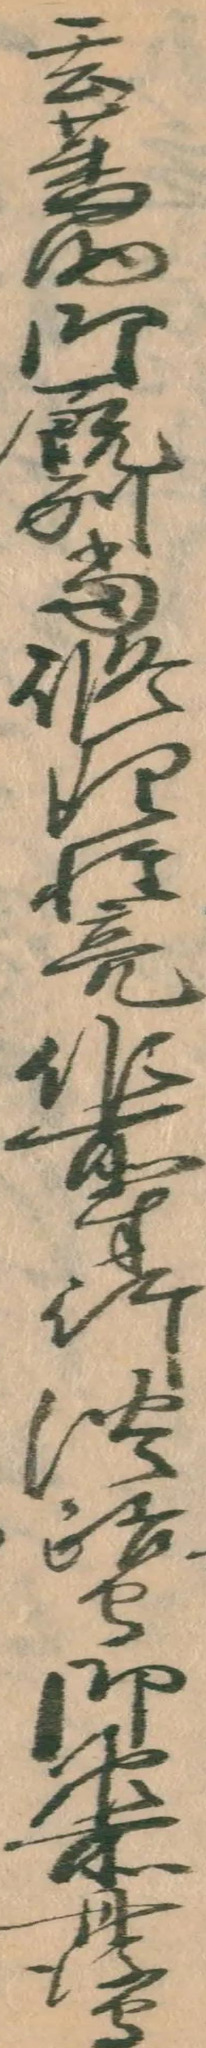玄蕃助御厩別当修理権亮候作所奉行淡路守御所丹後守
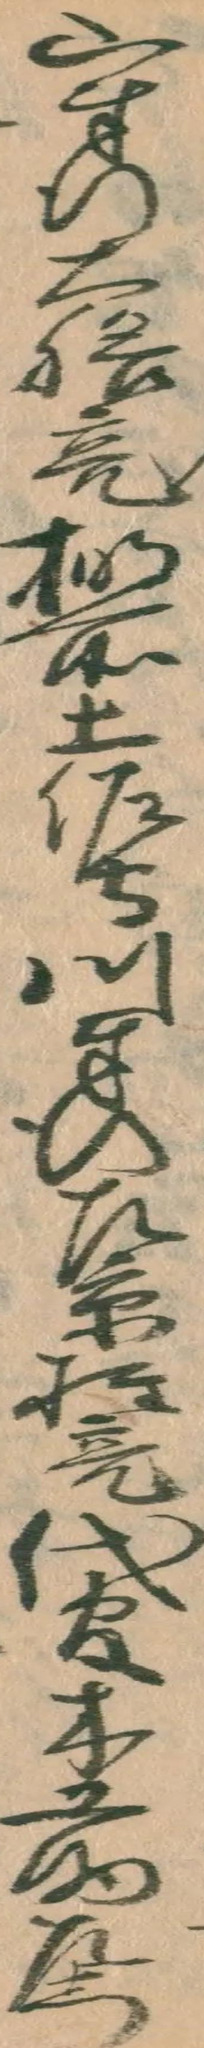山奉行大膳亮棚所土佐守川奉行左京権亮代官木工助左衛門
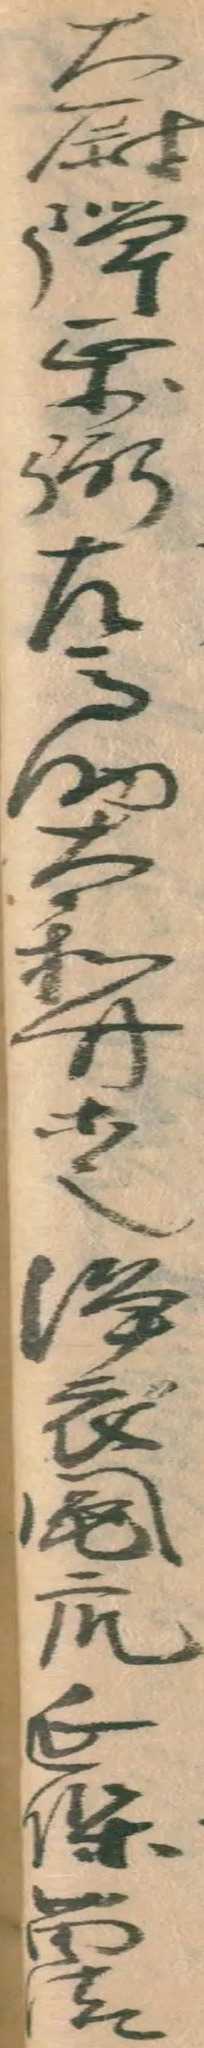大尉弾正少弼左馬助大和介等也浄衣鬮衆延保清
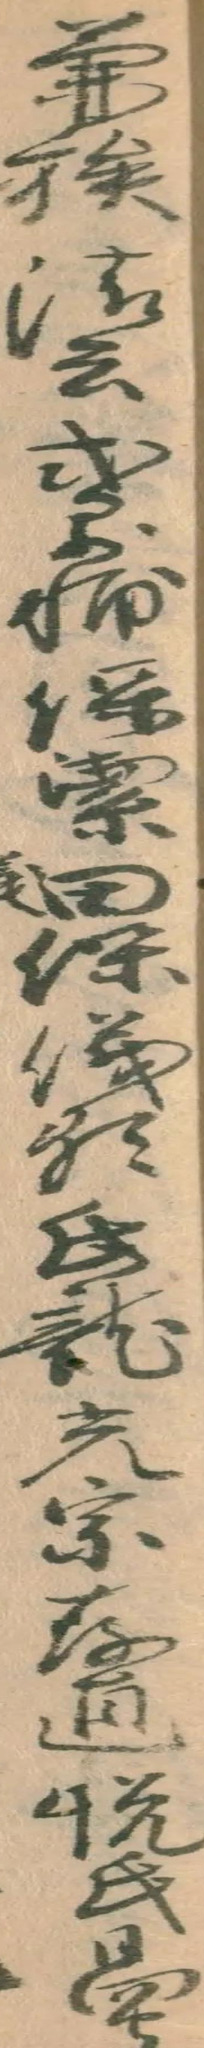兼族清言式部少輔保潔田保儀顕氏龍光宗存直悦氏日向守
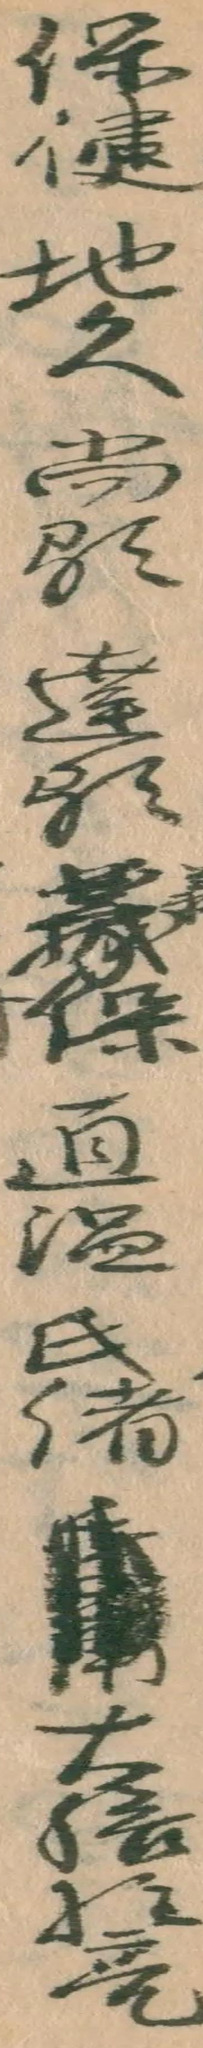保健地久尚顕達顕義保直温氏諸大膳権亮
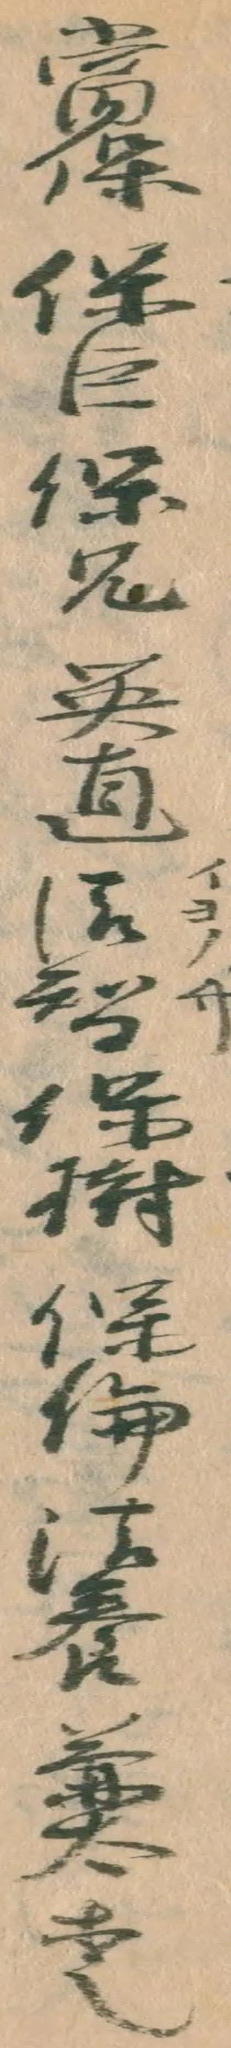当保保巨保兄英直清智保樹保倫清養兼太等也
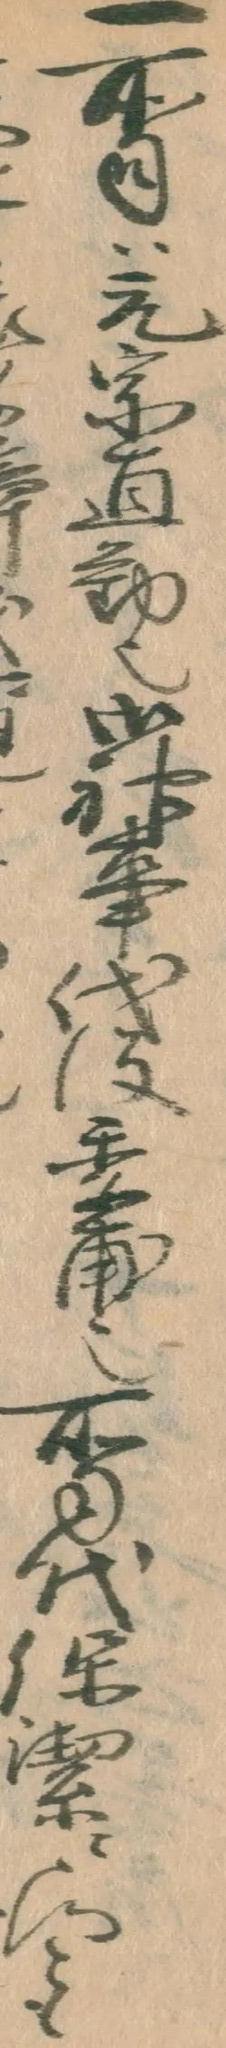一所司ハ元宗直勤也御神事代役季甫也所司代保潔ニ候得とも
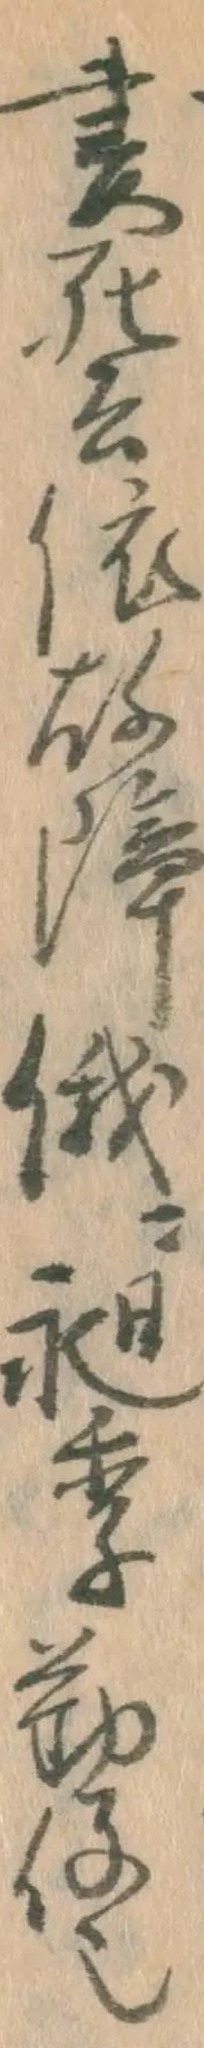妻死去依故障俄ニ昶季勤役也
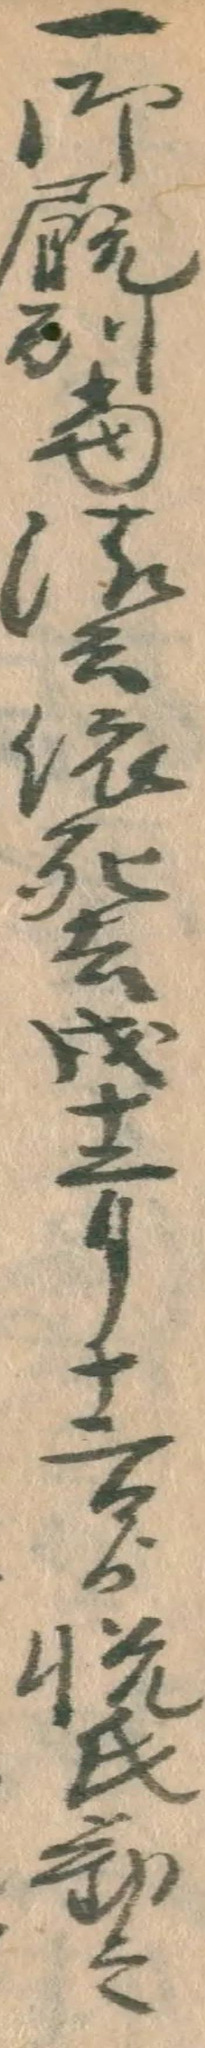一御厩別当清言依死去戌十二月十二日ゟ悦氏勤之
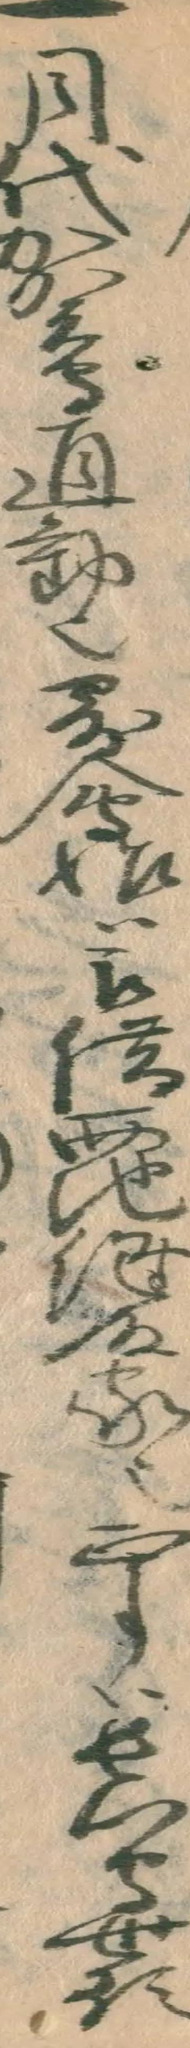一月代加賀守直勤也寄会始ハ被借殿家也正月ハ長門守世顕
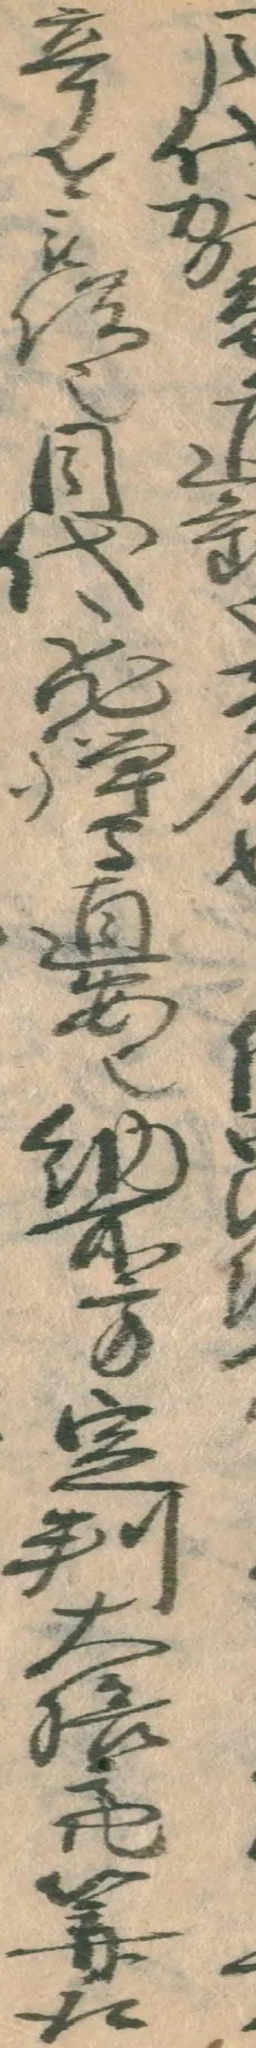亭を被借也目代へ飛騨守直安也納所方定判大膳亮算取
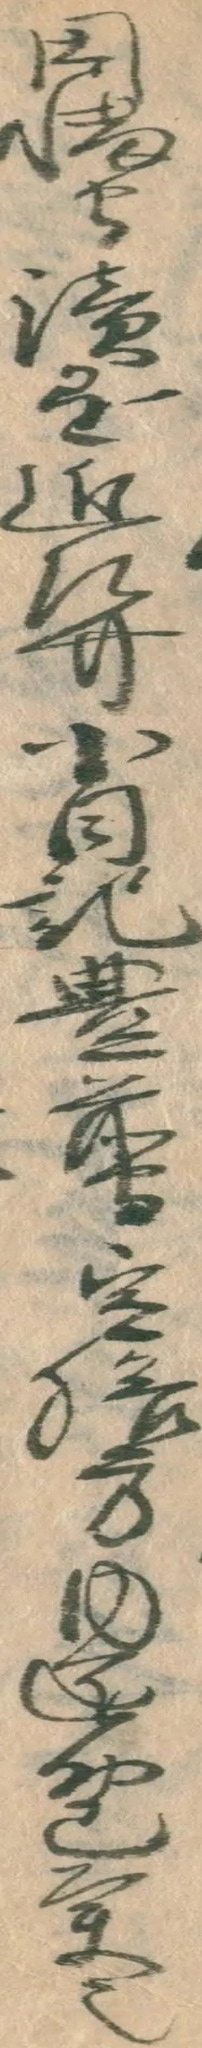因幡守読懸近江介小日記豊前守定膳方内匠助巳大夫也
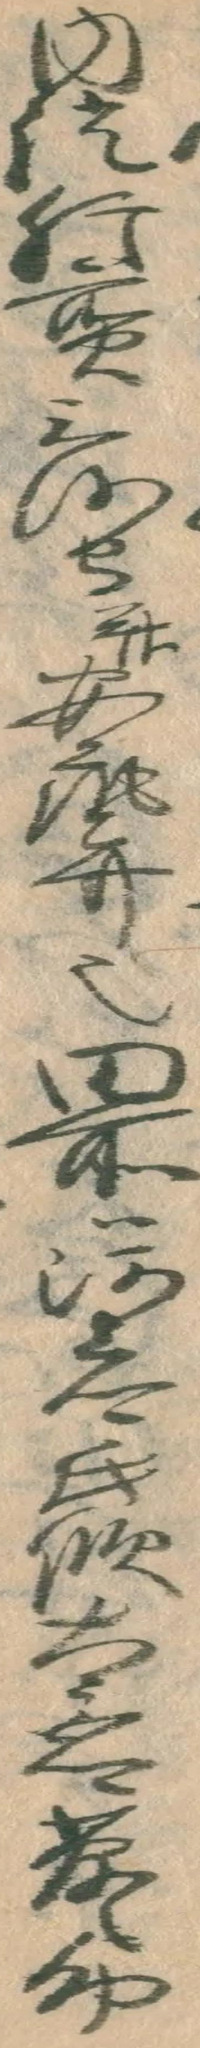内証肝煎三河守幷安芸介也田所ハ河上郷氏領大宮郷菅之助
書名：賀茂社記録. 第60冊
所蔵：国立国会図書館 National Diet Library, JAPAN
